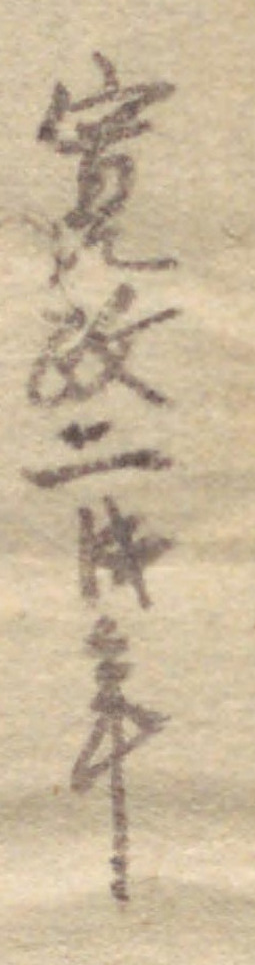寛政二戌年

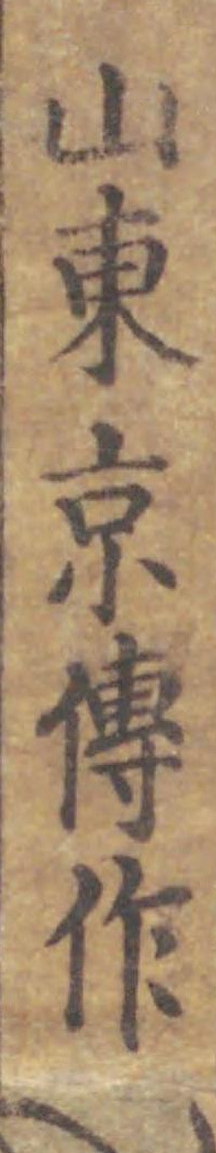山東京伝作

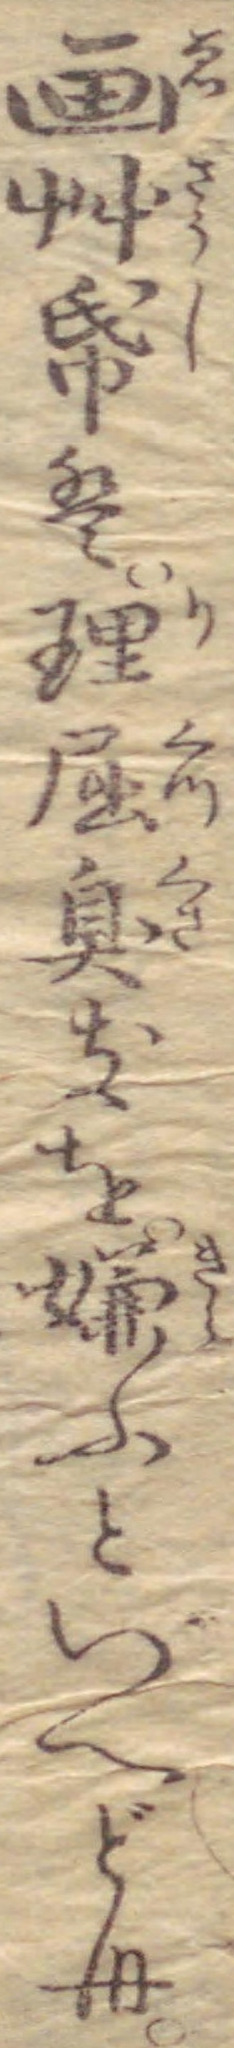絵草紙は理屈臭きを嫌ふといへども
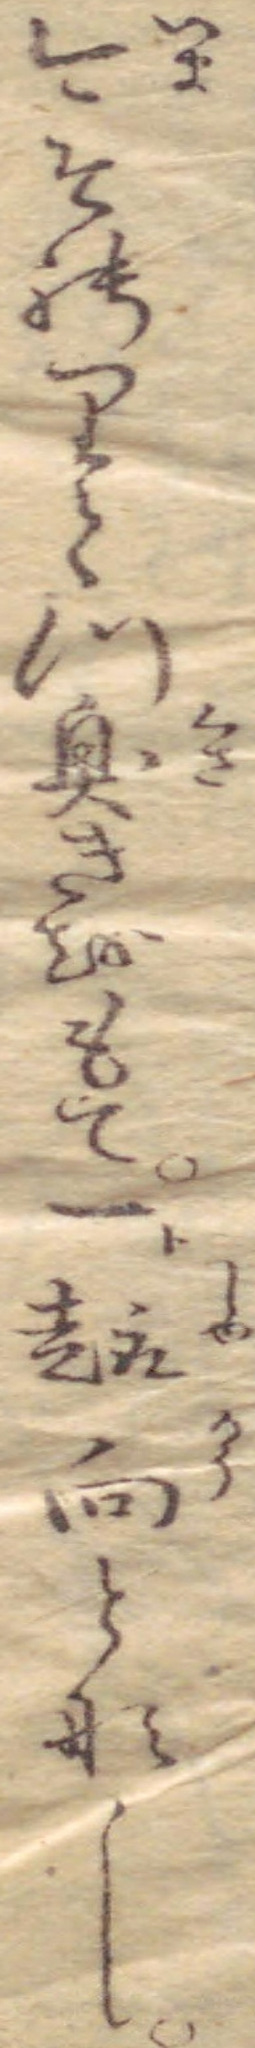今そのりくつ臭きをもつて。一と趣向となし。
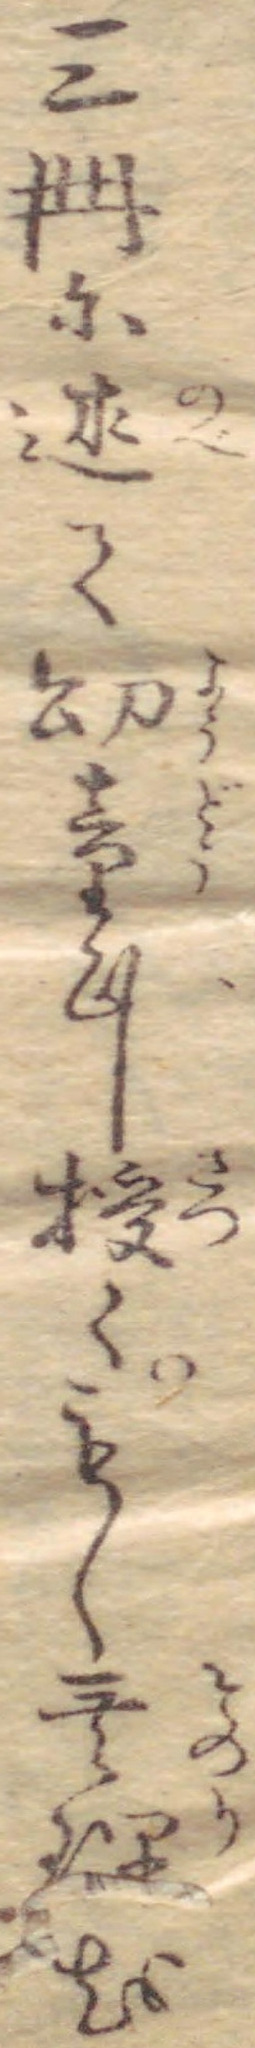三冊に述て幼童に授。もし其理を
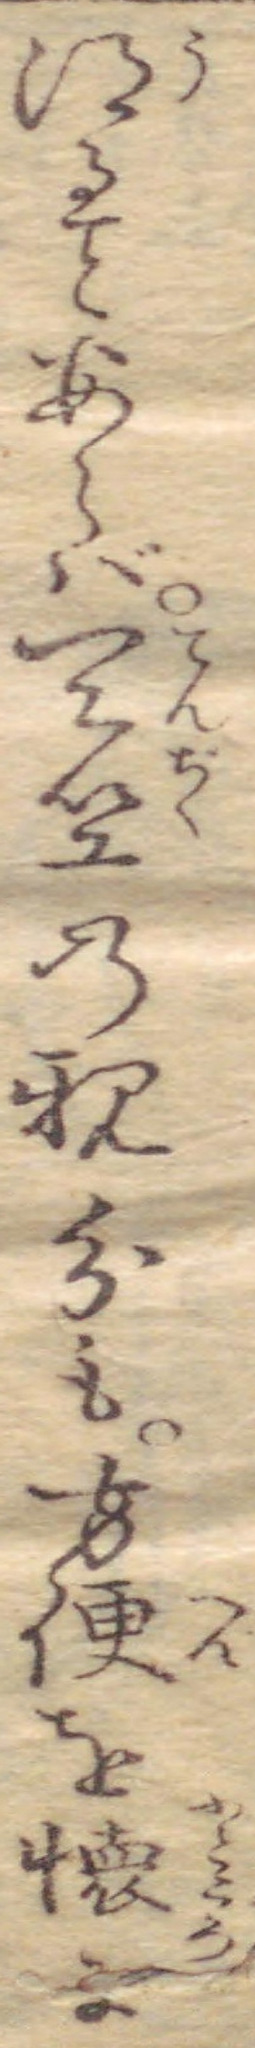得ることあらば。天竺の親分も。方便を懐に
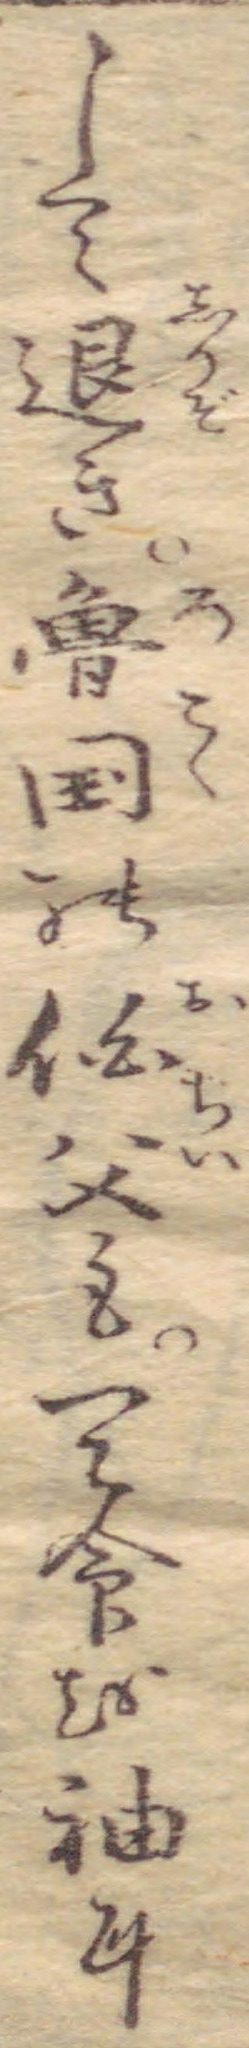して退き。魯国の伯父も。其命を袖に
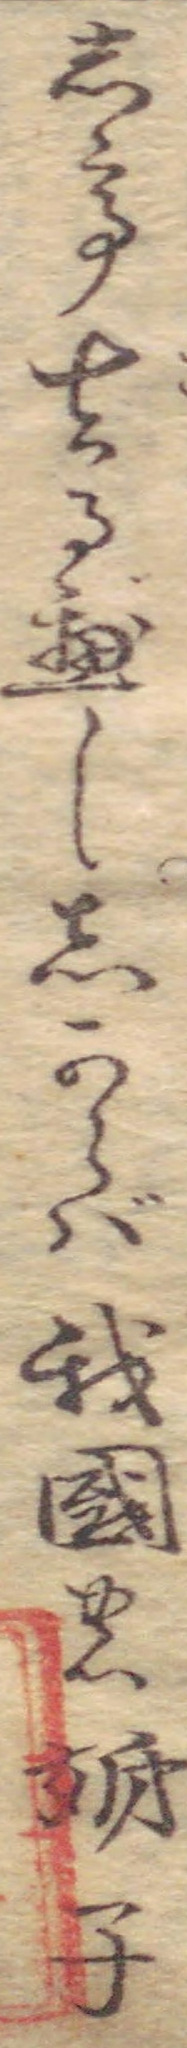して去るへし。しからば我国の
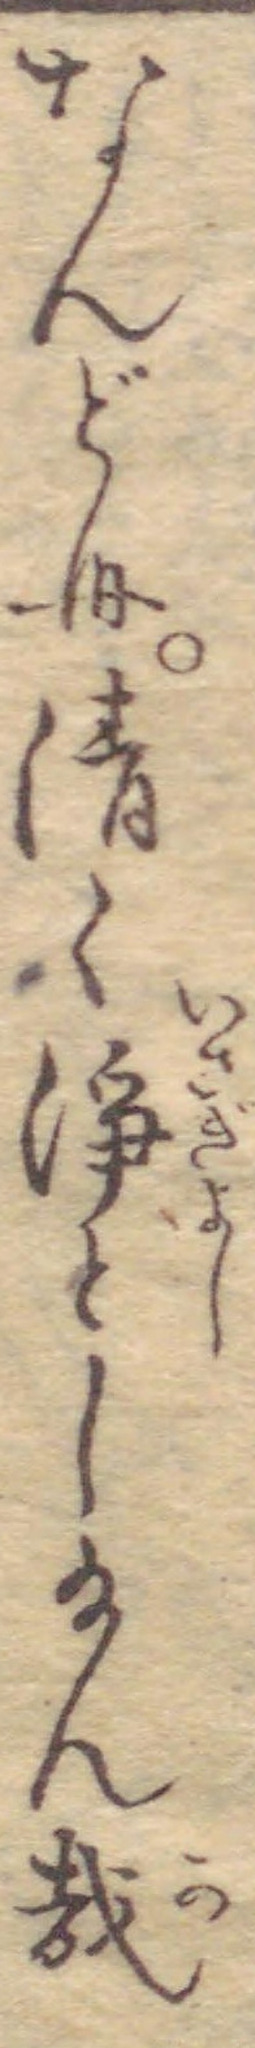なんども。清く浄とし給ん歟
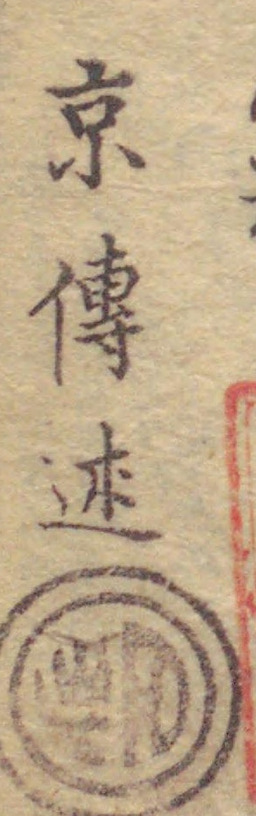京伝述
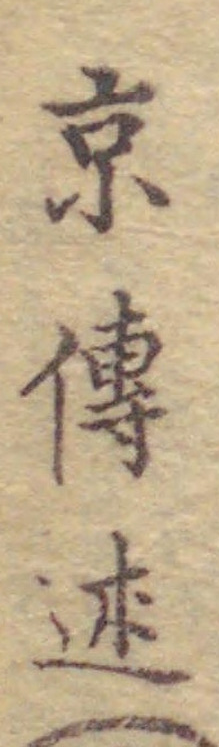京伝述

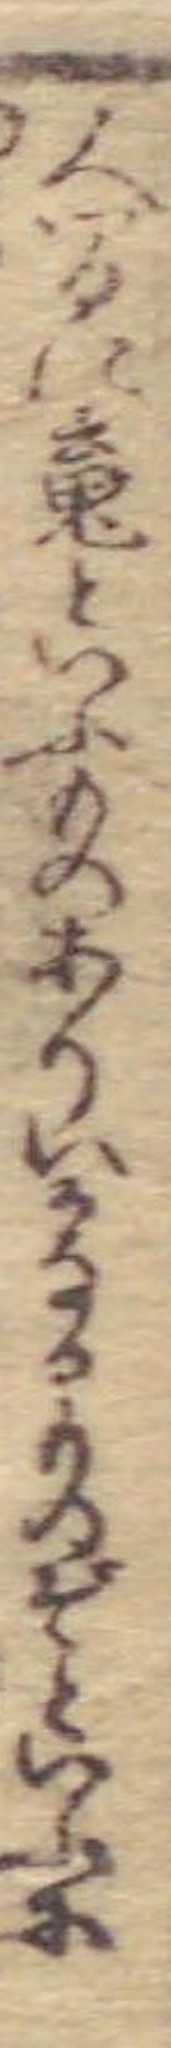人間に魂といふものありいかなるものぞといふに
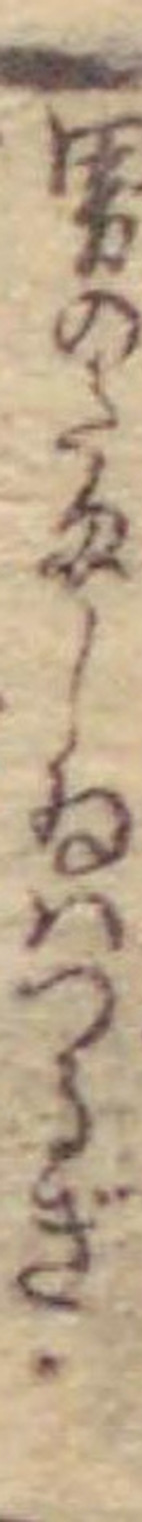男のたましゐはつるぎ
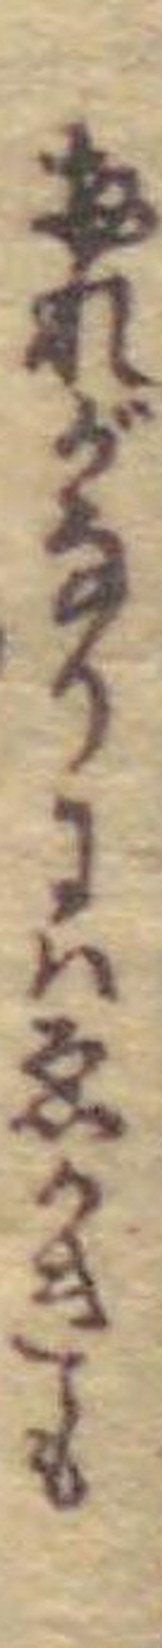おれがなりにはゑかきも
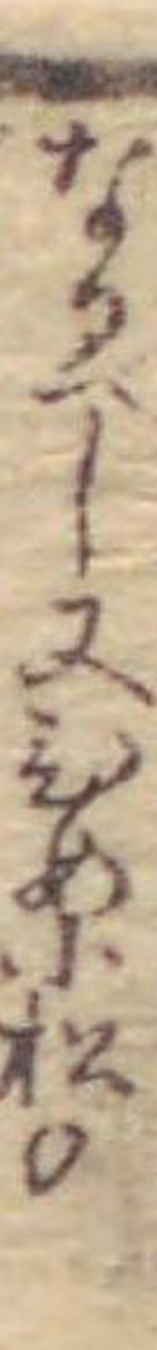なるへし又ひめ小松の
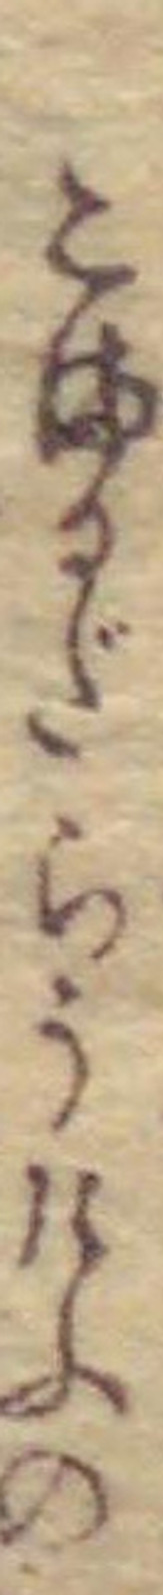こまるだらうけふの
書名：心学早染艸 : 3巻
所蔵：国立国会図書館 National Diet Library, JAPAN
